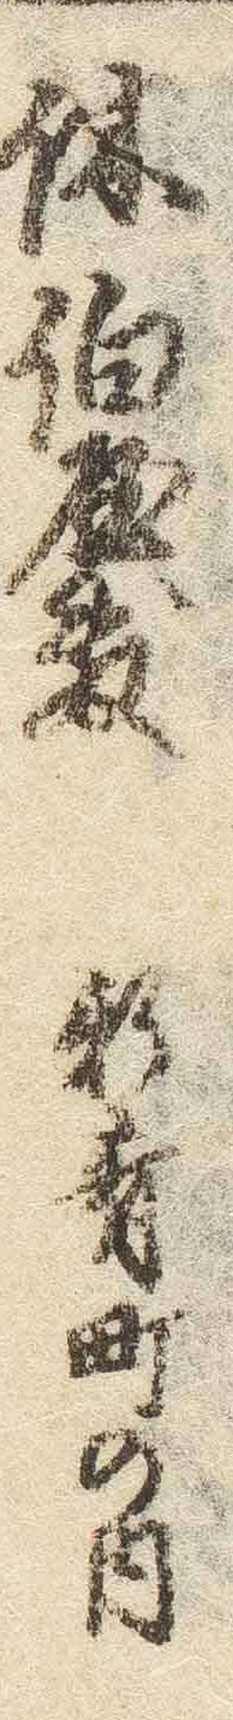休伯屋敷新肴町の内
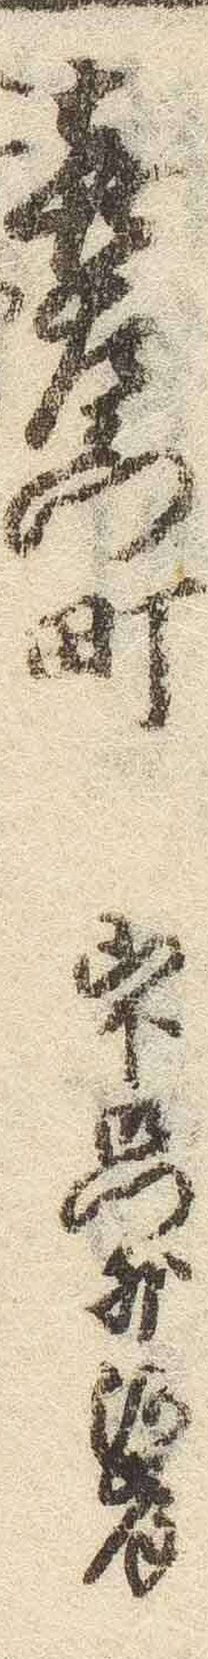喜左衛門町山下御門外河岸
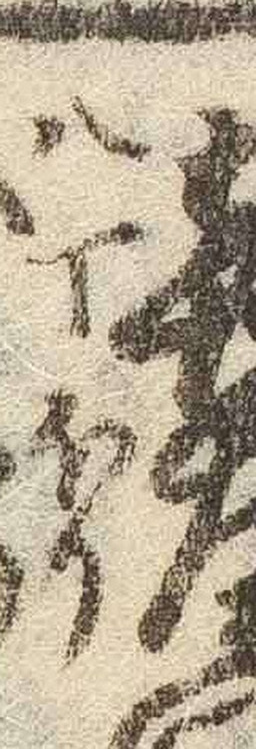八丁ほり
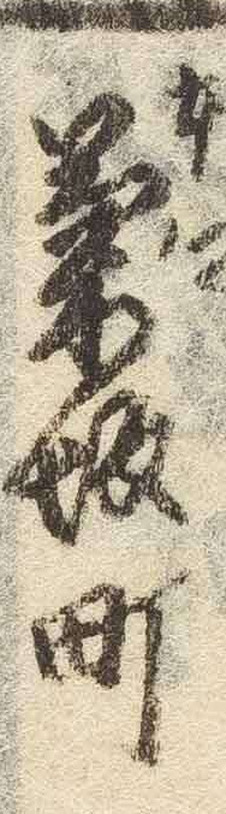菊坂町
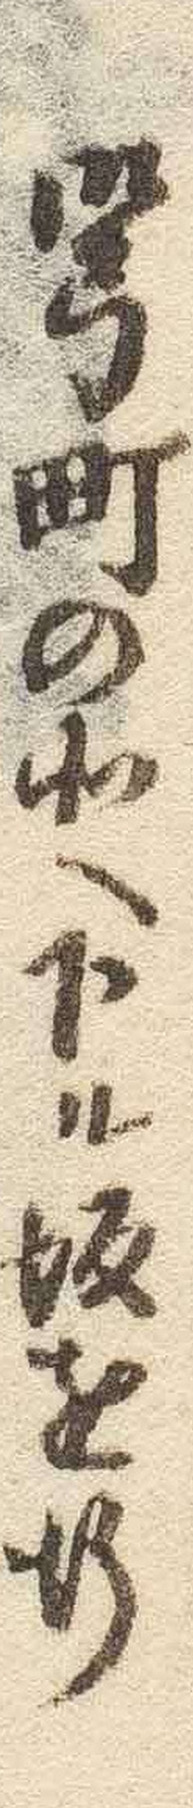御弓町の北へ下ル坂を行
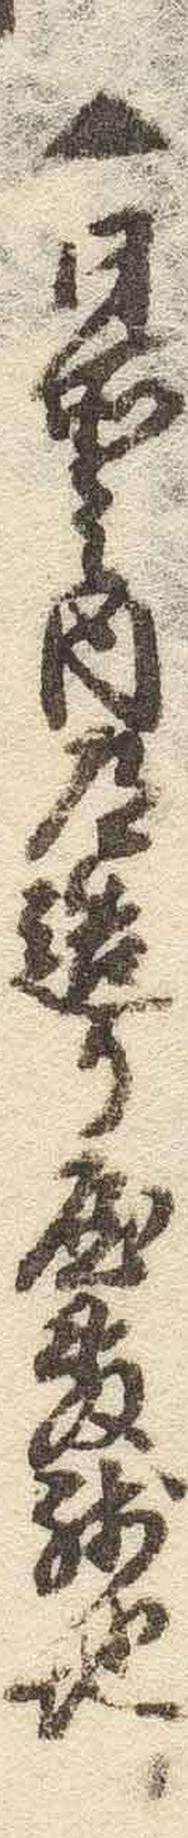▲同所之内道造り屋敷残地
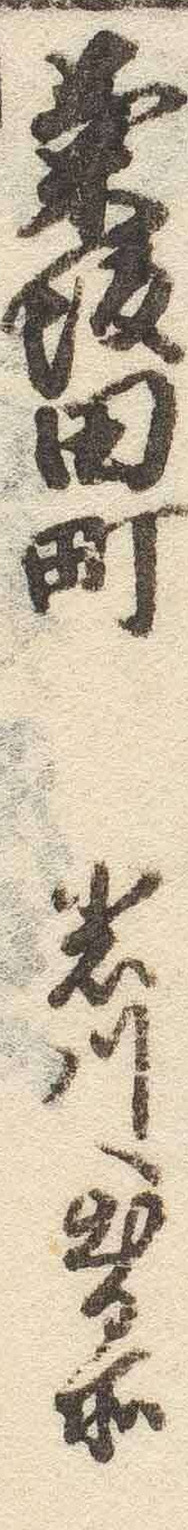菊坂田町小石川へ出る所
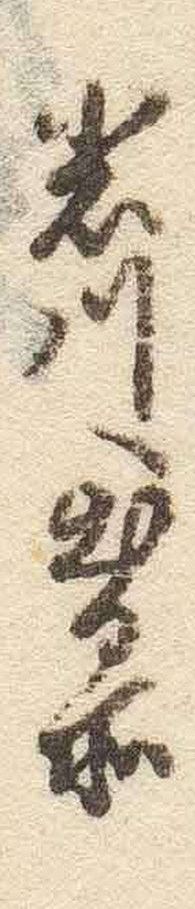下谷へ出る所
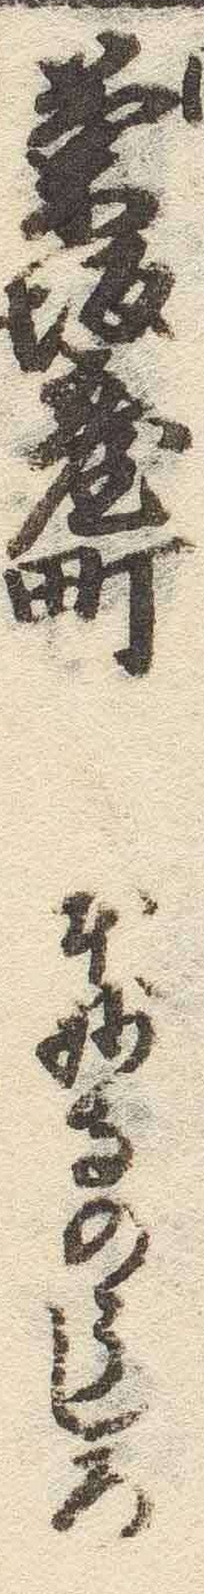菊坂臺町本妙寺のうしろ
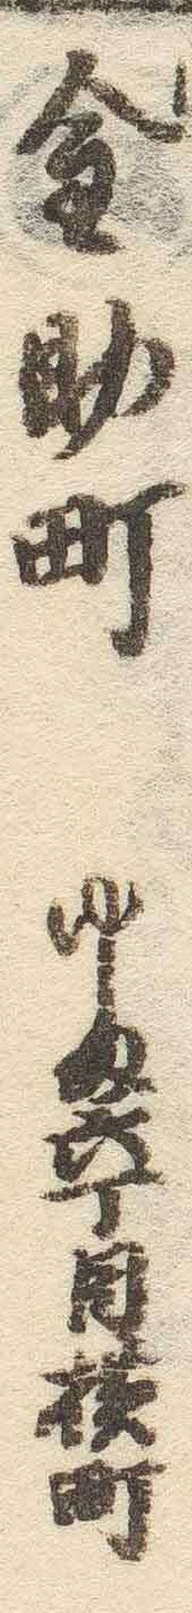金助町ゆしま六丁目横町
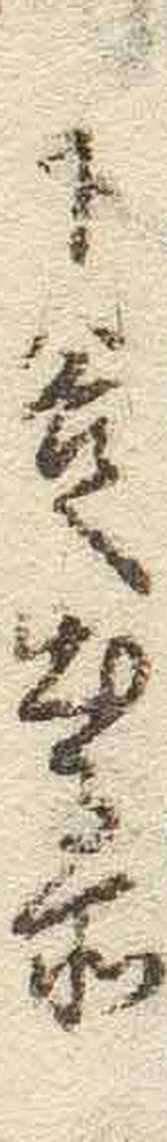下谷へ出る所
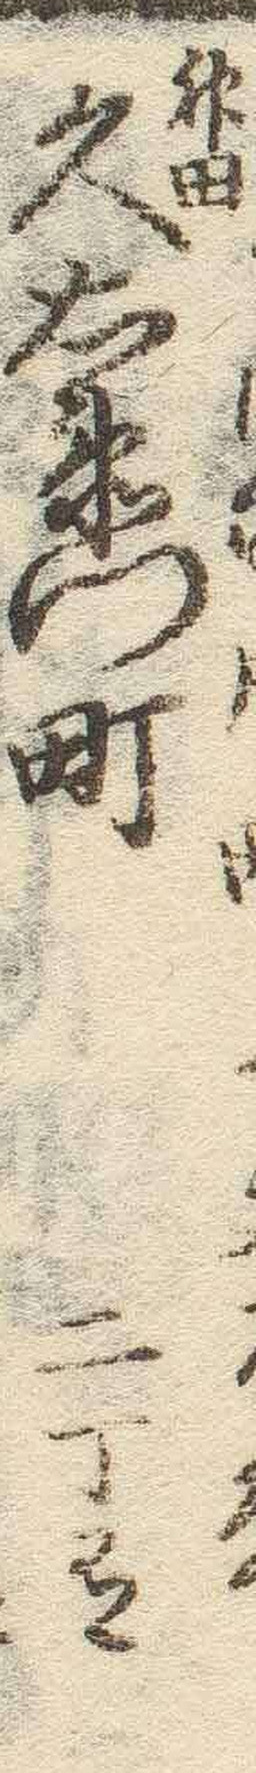久右衛門町二丁有
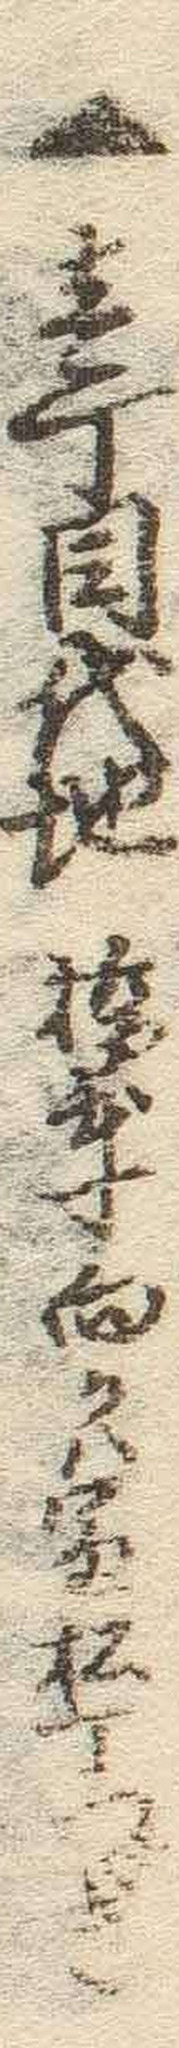▲壱丁目代地橋本丁向かは冨松丁つゞき
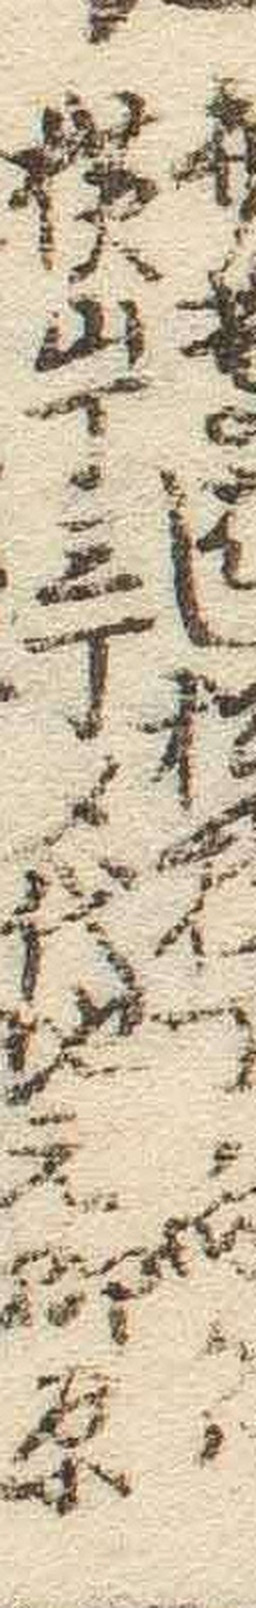横山丁三丁メ代地元柳原
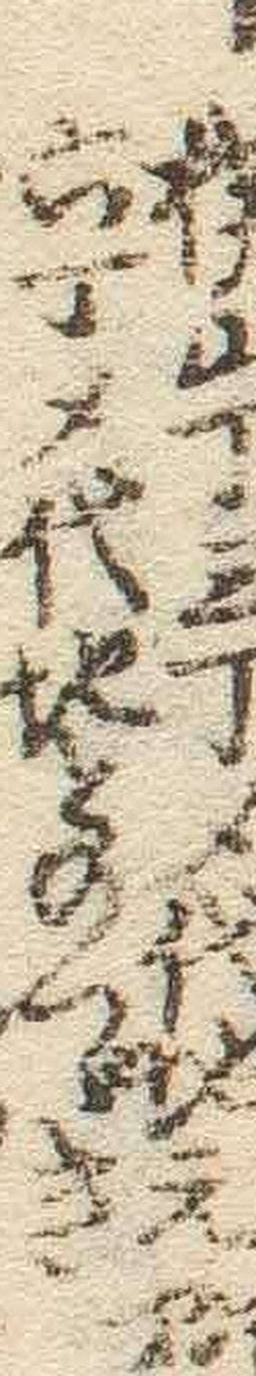六丁メ代地とのつゞき
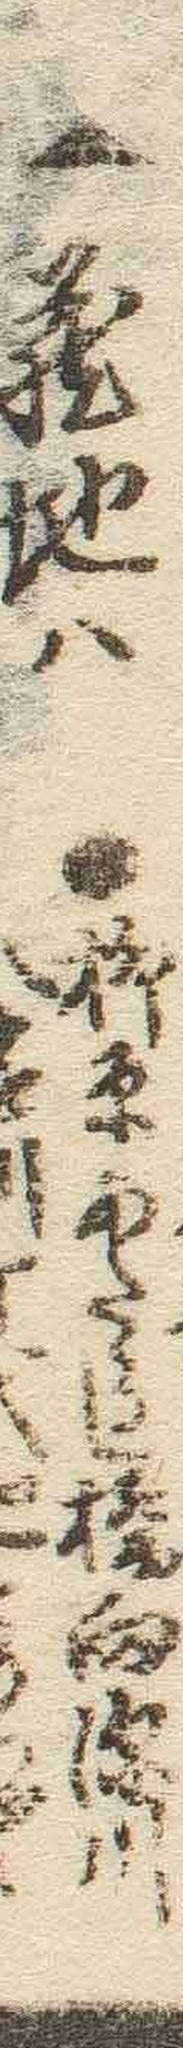▲蔵地は●柳原あたらし橋向深川
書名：江戸町独案内
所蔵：東京学芸大学附属図書館 国文学研究資料館
